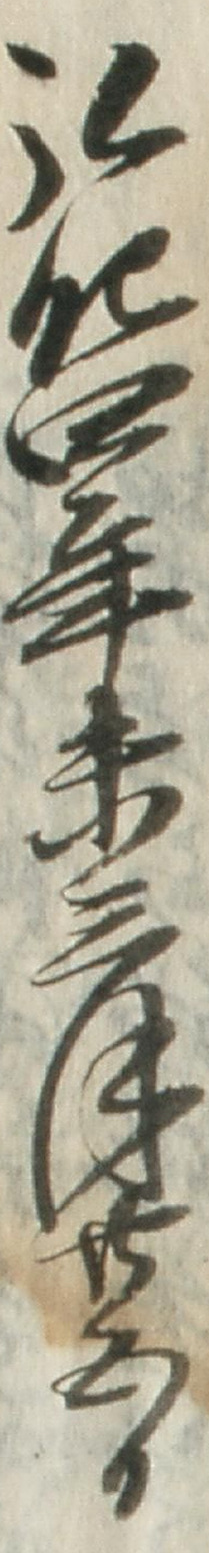弘化四年未三月廿五日
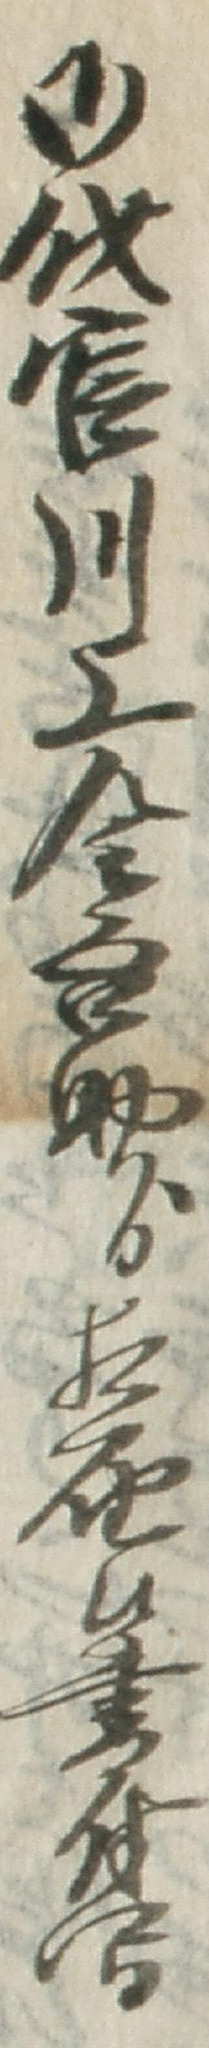御代官川上金吾助ゟ相届候書付写
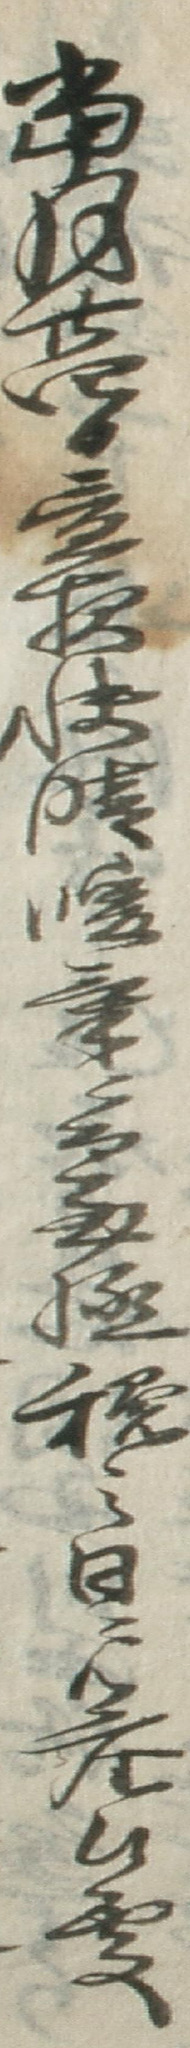当月廿四日昼夜快晴暖気二而至極穏之日二御座候処
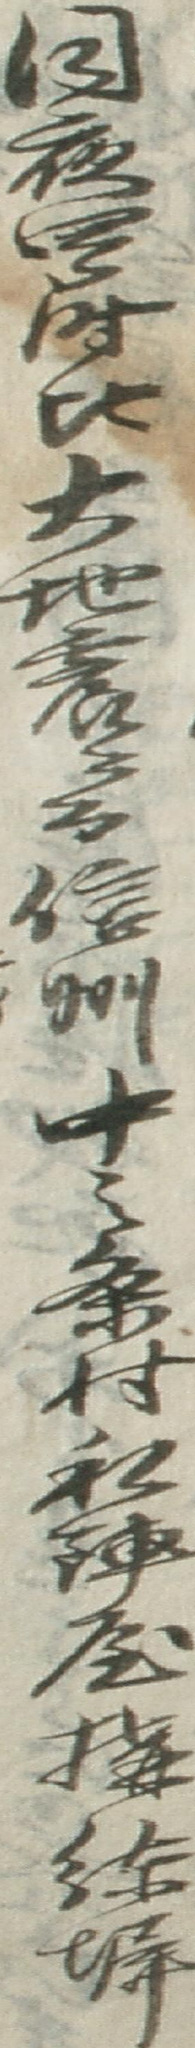同夜四ッ時比大地震二而信州中之条村私陣屋構練塀
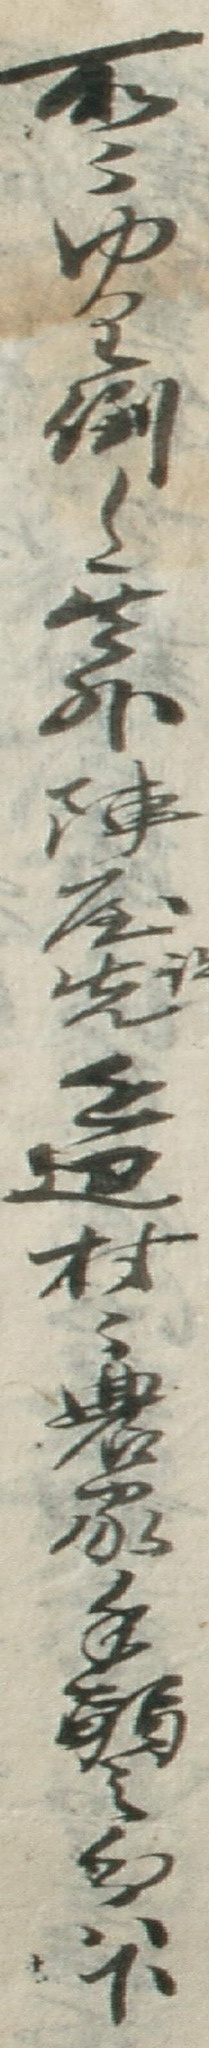所々ゆり倒し候其外陣屋先近辺村々農家手弱之分ハ下
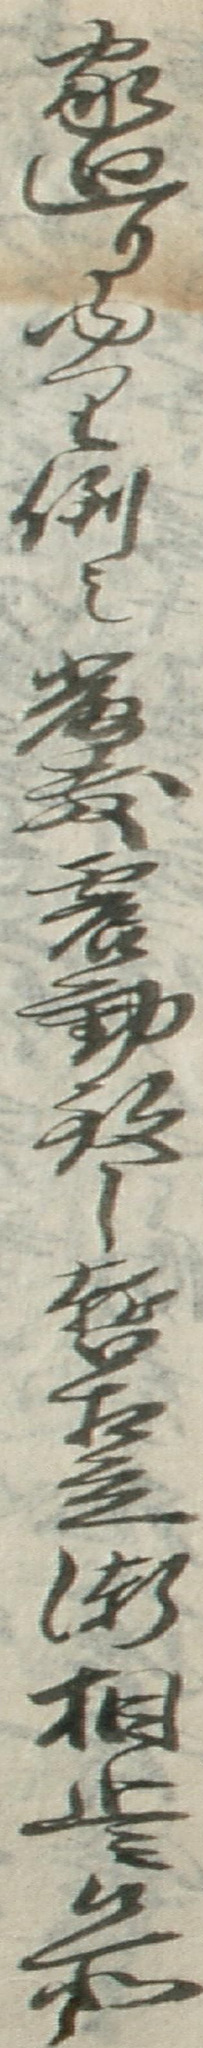家廻りゆり倒し厳敷震動致し暫相立漸相止ミ候所

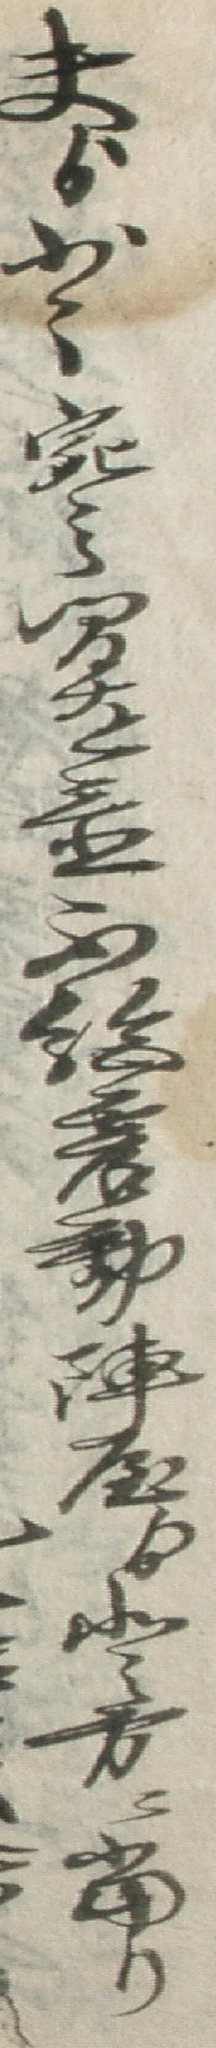夫ゟ少々宛之間を置不鎮震動陣屋より北之方二当り
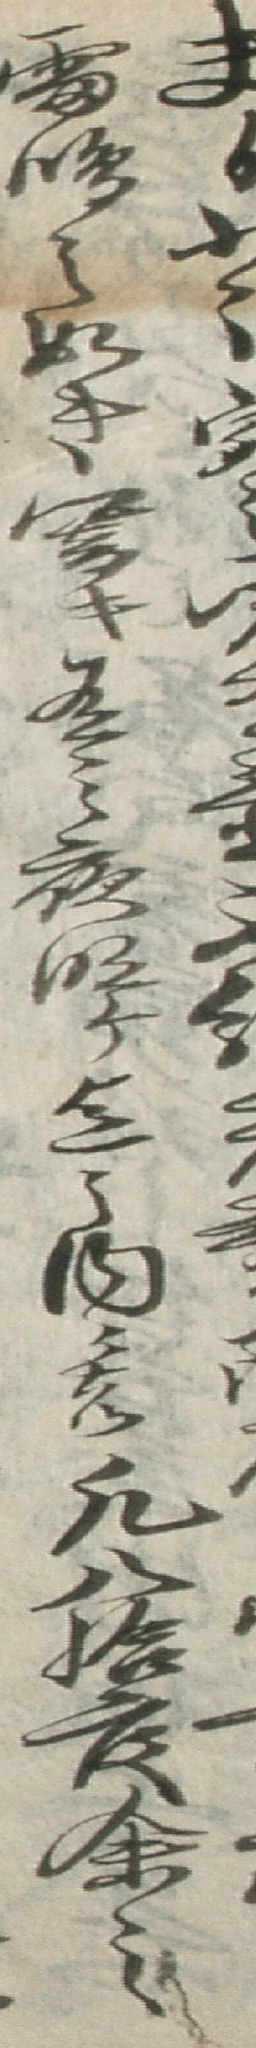雷鳴之如き響キ有之夜明ヶ迄之内二は凡八拾度余之
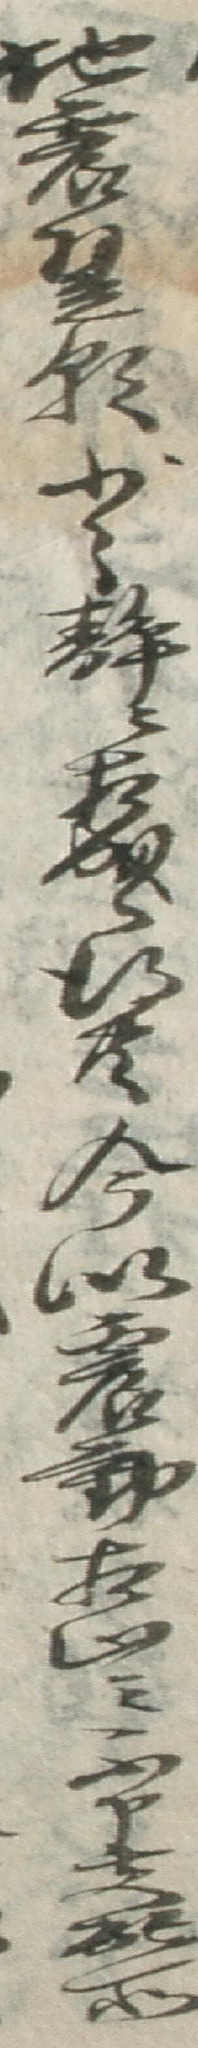地震翌朝少々静二相成候得共今以震動相止不申支配所
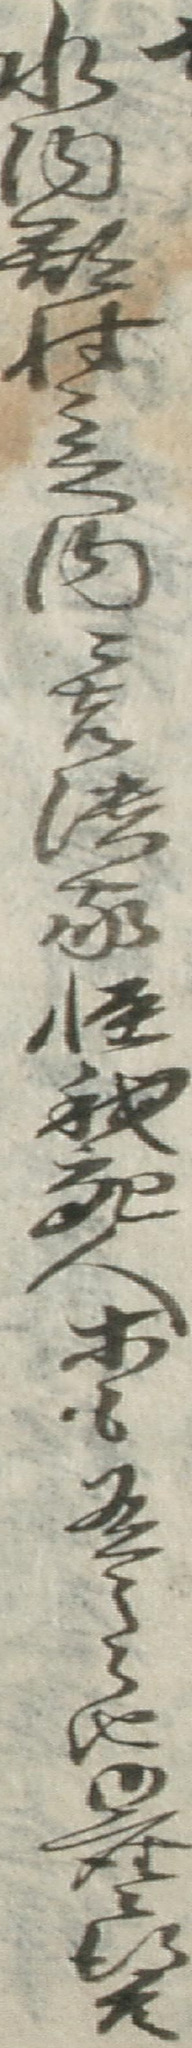水内郡村々之内二は潰家怪我死人等も有之由御座候得共
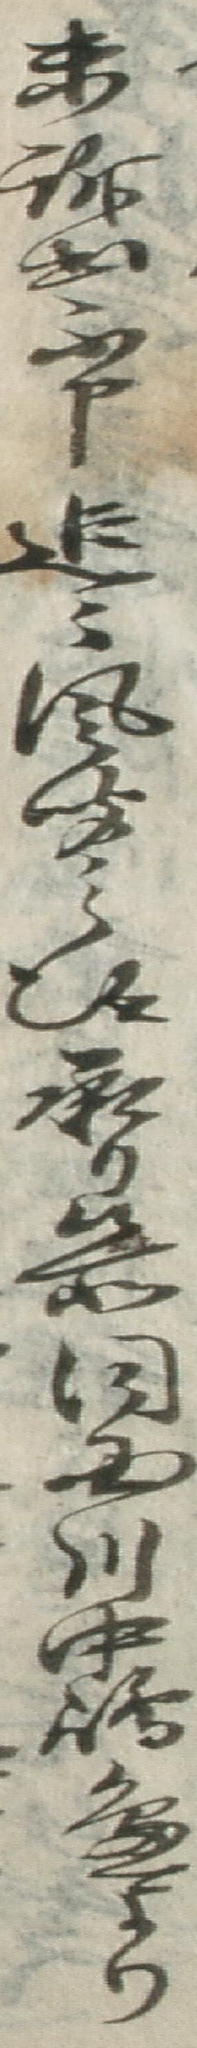未訴出不申追々風聞之趣承り候所同国川中島辺より
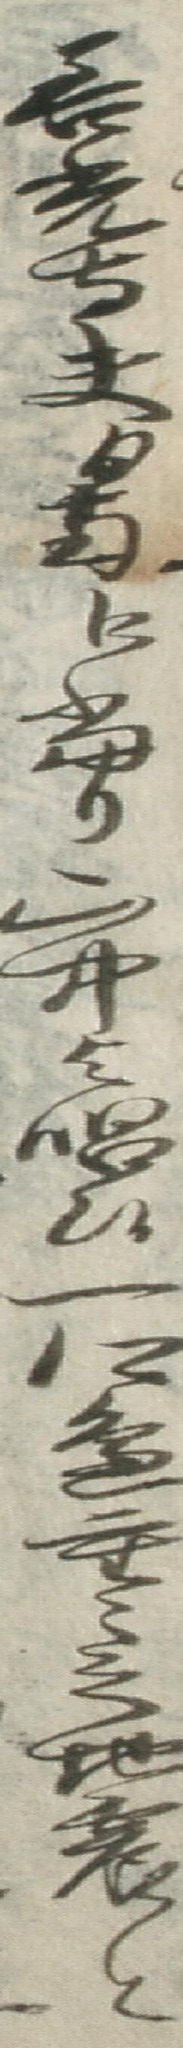善光寺夫ゟ南江当り山中と唱候一郷辺重々之地震と
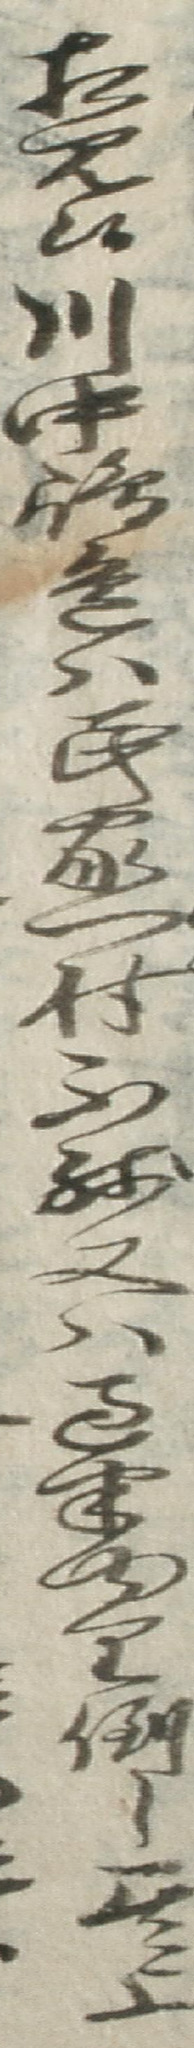相見候川中嶋辺ハ民家一村不残又ハ過半ゆり倒し其上
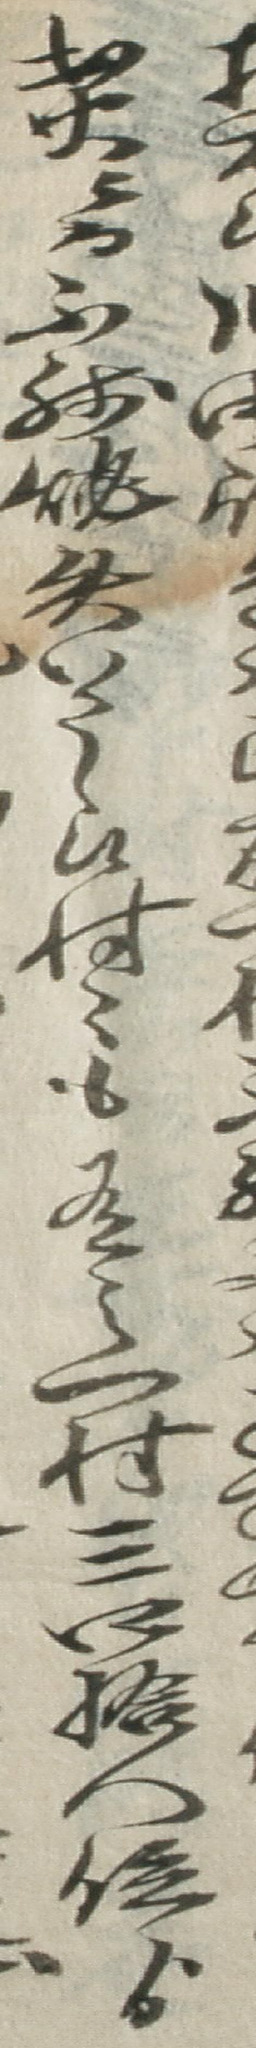出火二而不残焼失いたし候村々も有之一村三四拾人位ゟ
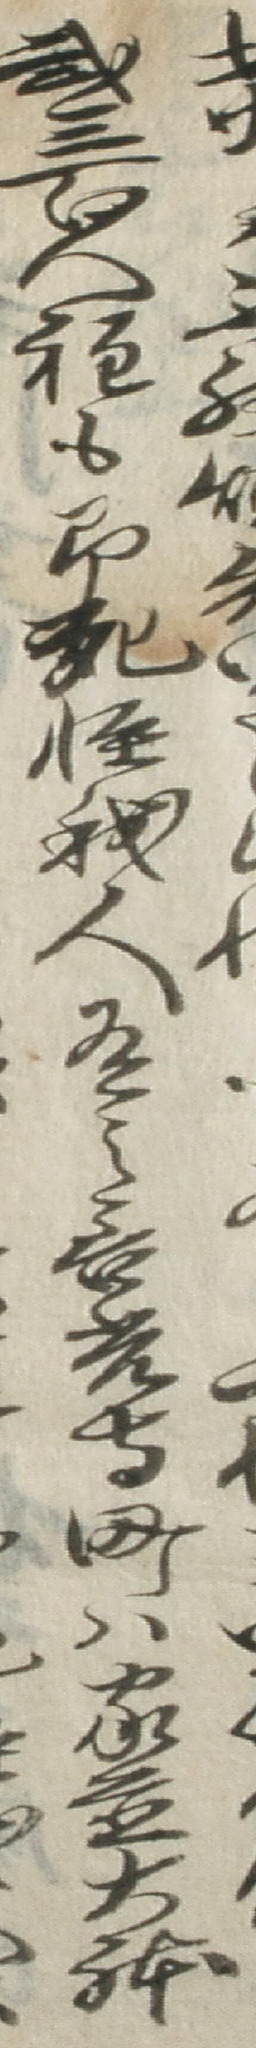弐三百人程も即死怪我人有之善光寺町ハ家並大体
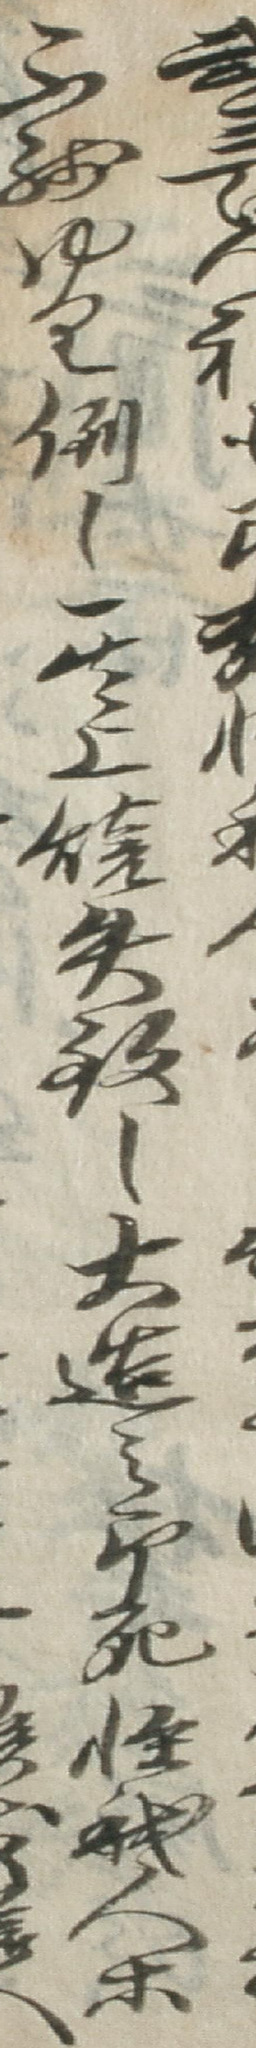不残ゆり倒し其上焼失致し大造之即死怪我人等
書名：信濃國地震實録記
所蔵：東京大学地震研究所図書室 Earthquake Research Institute Library, The University of Tokyo, JAPAN
